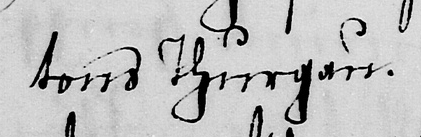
tons Thurgau.
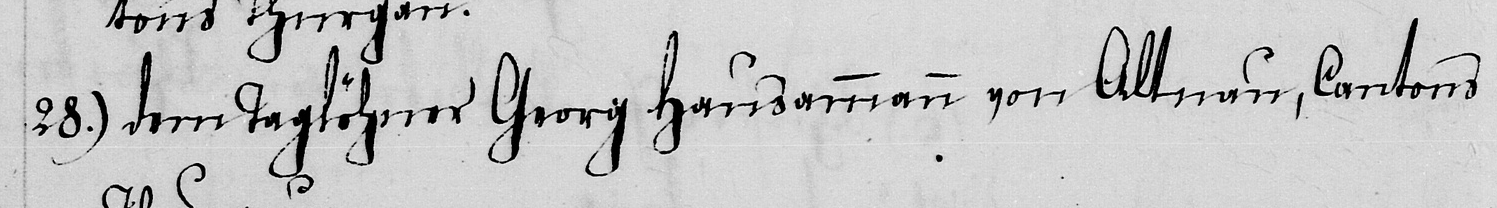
28.) dem Taglöhner Georg Hausammann von Altnau, Cantons
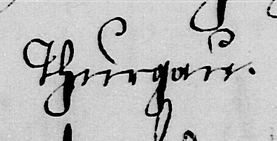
Thurgau.
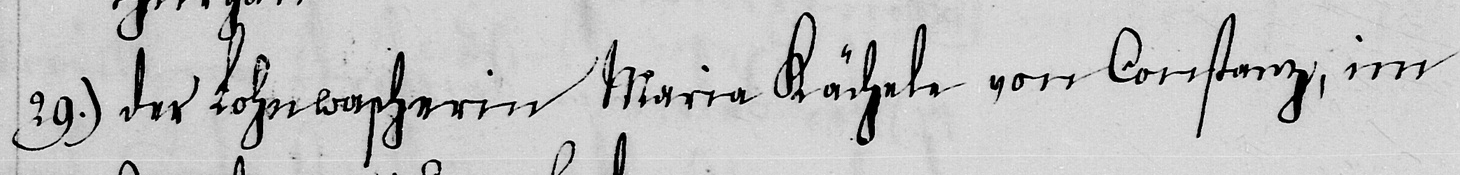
29.) der Lohnwascherin Maria Kächele von Constanz, im
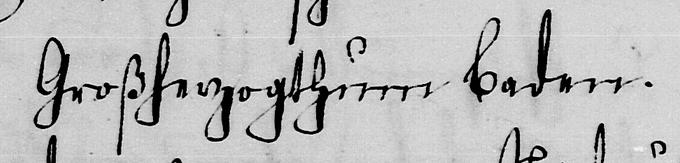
Großherzogthum Baden.
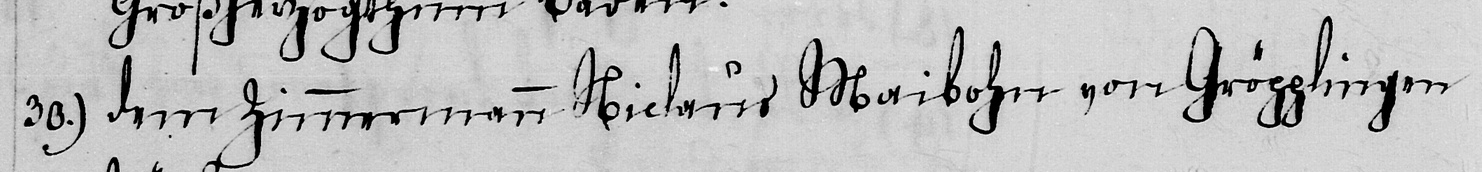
30.) dem Zimmermann Niclaus Maibohn von Gröpplingen
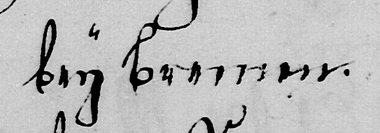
bey Bremen.
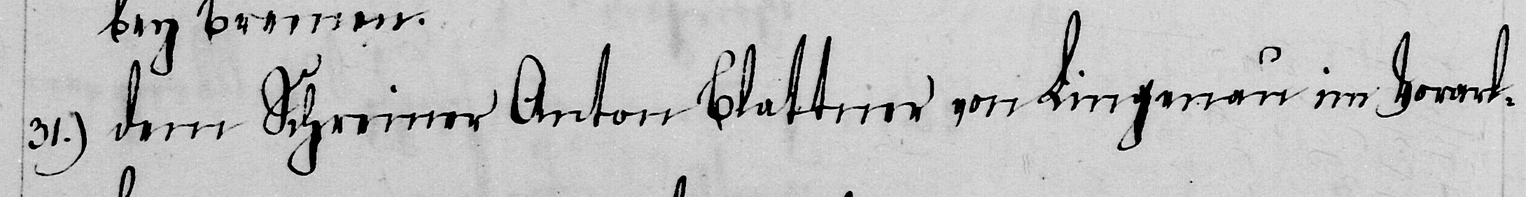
31.) dem Schreiner Anton Blattner von Lingenau im Voral¬
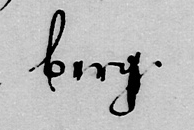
berg.
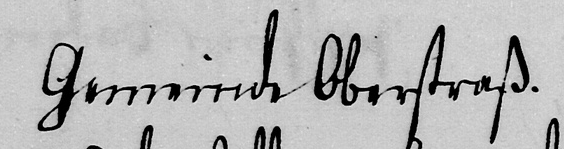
Gemeinde Oberstraß.
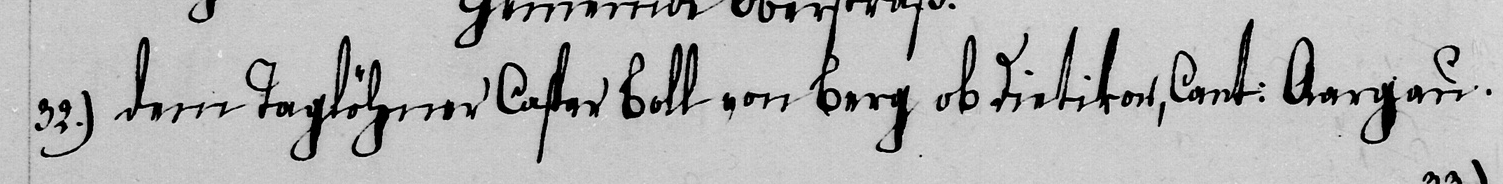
32.) dem Taglöhner Caspar Boll von Berg ob Dietikon, Cant: Aargau.
